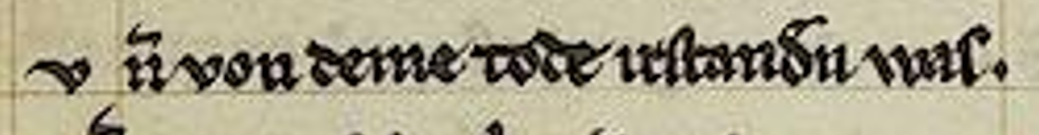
Vn(d) von deme tode irſtandn waſ.
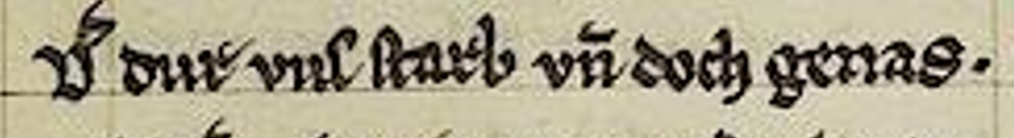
D(er) dur vnſ ſtarb vn(d) doch genas.
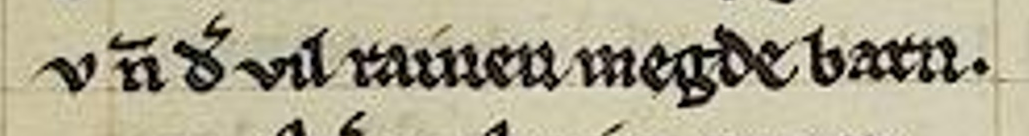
Vn(d) d(er) vil rainen megde barn.
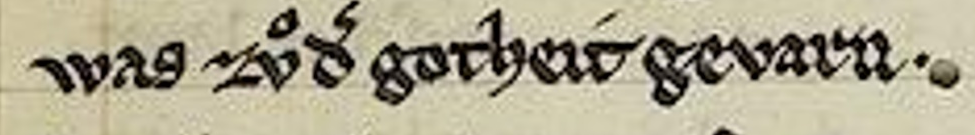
Was zv°o d(er) gotheit gevarn.
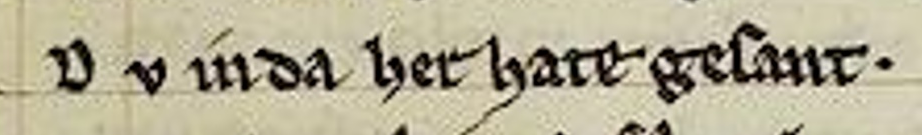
Dv in da her hate geſant.
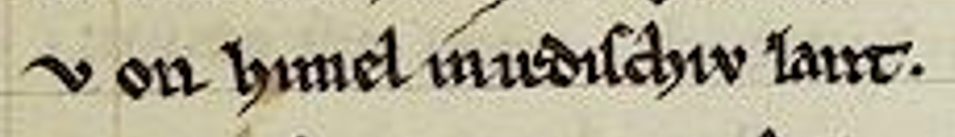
Von himel in irdiſchiv lant.
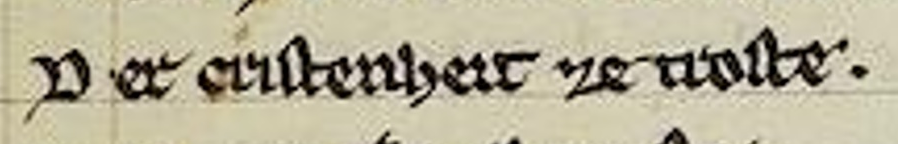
Der criſtenheit ze troſte.
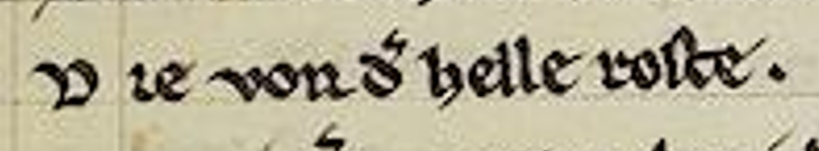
Die von d(er) helle roſte.
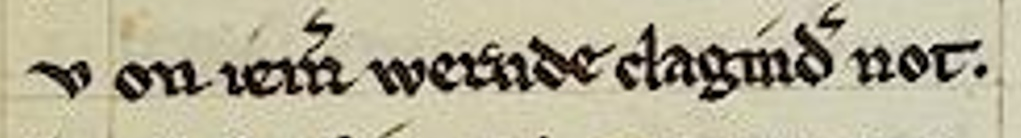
Von iem(er) wernde clagind(er) not.
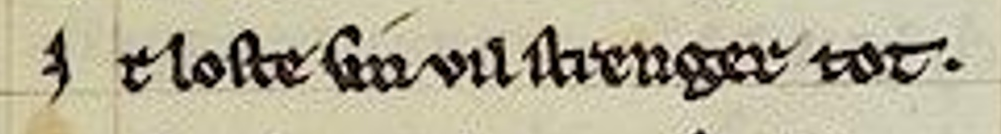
Irloſte ſin vil ſtrenger tot.
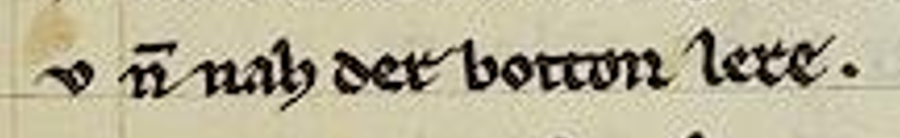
Vn(d) nah der botton lere.
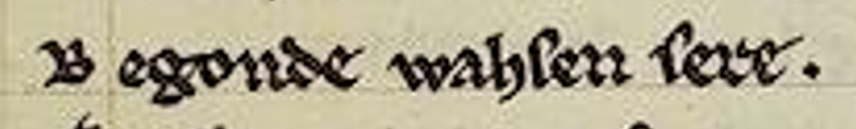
Begonde wahſen ſere.
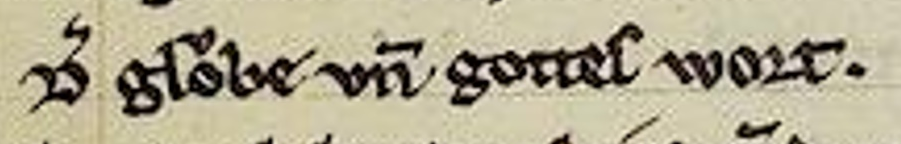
D(er) glo°vbe vn(d) gotteſ wort.
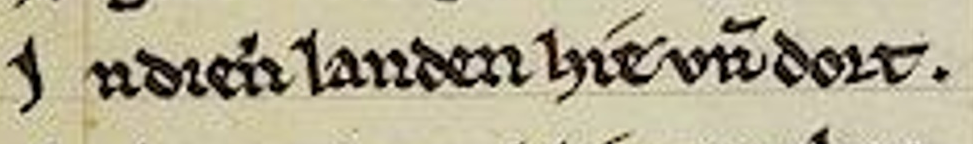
Indien landen hie vn(d) dort.
